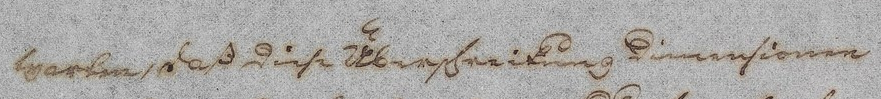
warten, daß diese Überschreitung Dimensionen
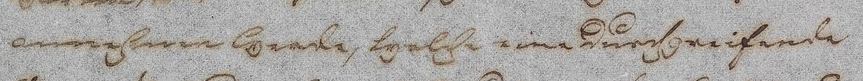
annehmen werde, welche eine durchgreifende
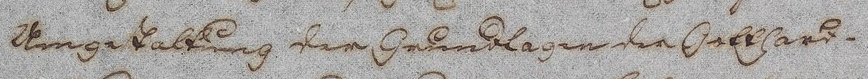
Umgestaltung der Grundlagen der Gotthard-
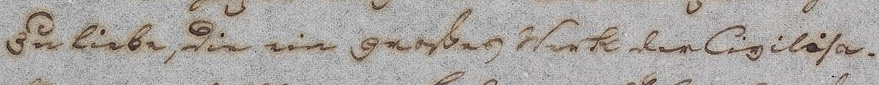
zuliebe, die ein großes Werk der Civilisa-
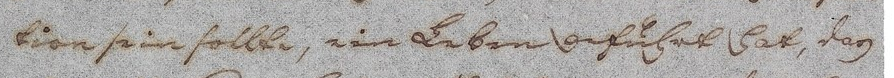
tion sein sollte, ein Leben geführt hat, das
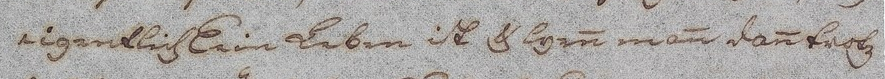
eigentlich kein Leben ist & wenn mann dann trotz
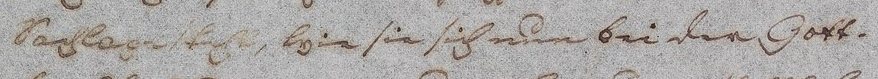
Sachlage steht, wie sie sich nun bei der Gott-
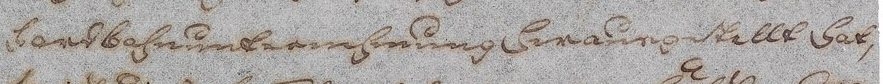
hardbahnunternehmung herausgestellt hat,
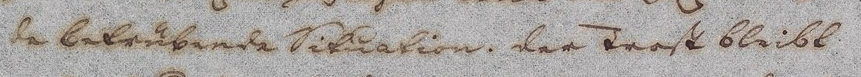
de betrübende Situation. Der Trost bleibt
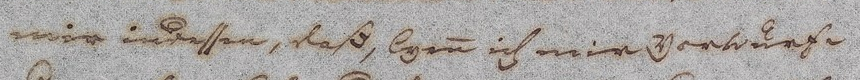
mir indessen, daß, wenn ich mir Vorwürfe
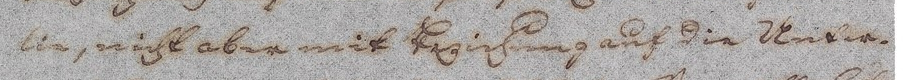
lie, nicht aber mit Beziehung auf die Unter-
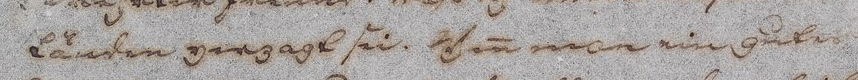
ständen verzagt sei. Wenn man ein gutes
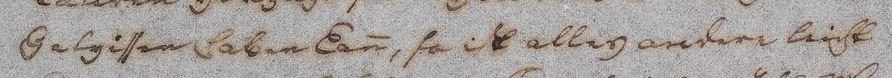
Gewissen haben kann, so ist alles andere leicht
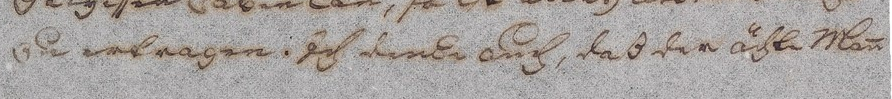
zu ertragen. Ich denke auch, daß der ächte Mann
